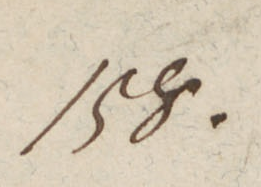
158.
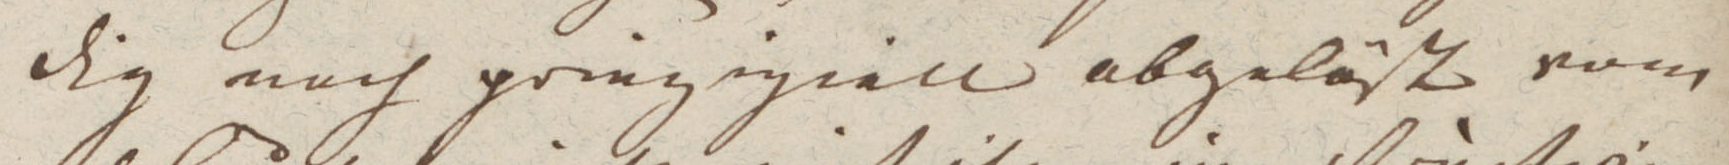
dig noch prinzipiell abgelöst vom
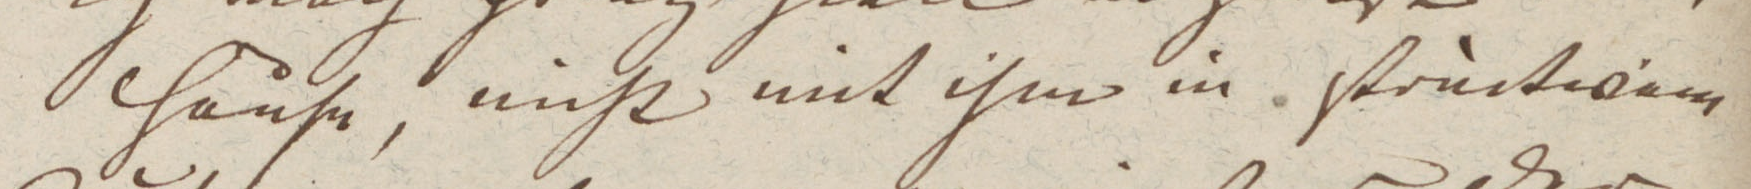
Hause, nicht mit ihm in structivem
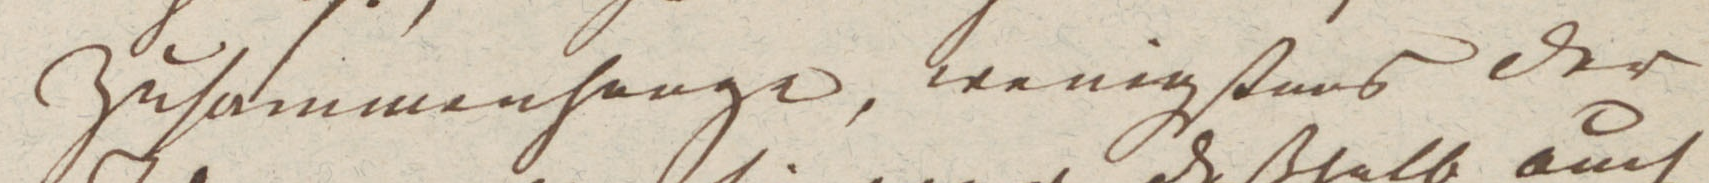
Zusammenhange, wenigstens der
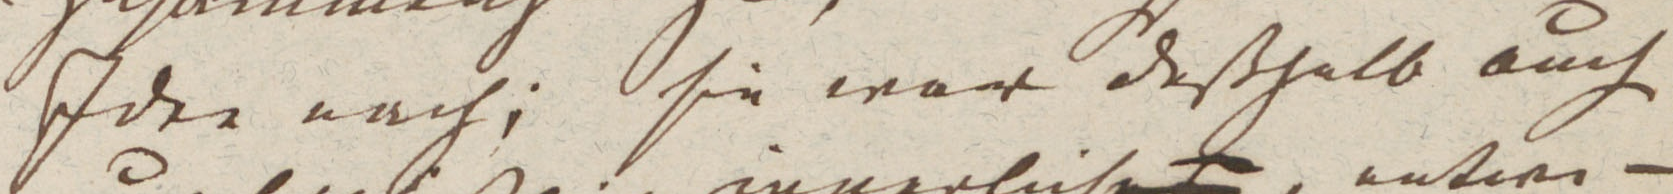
Idee nach; sie war desshalb auch
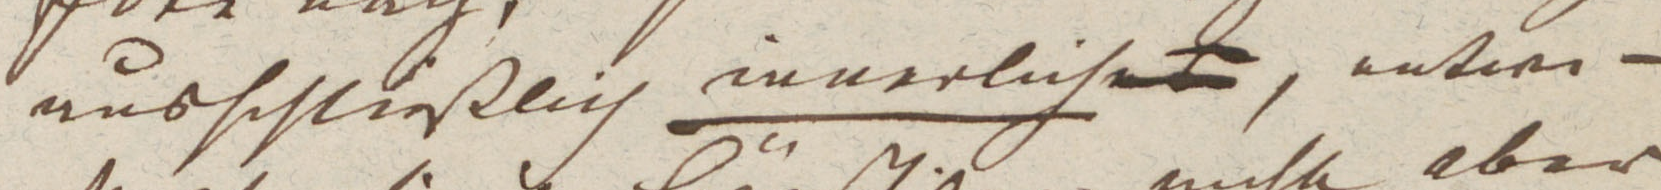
ausschliesslich innerliches, entwi-
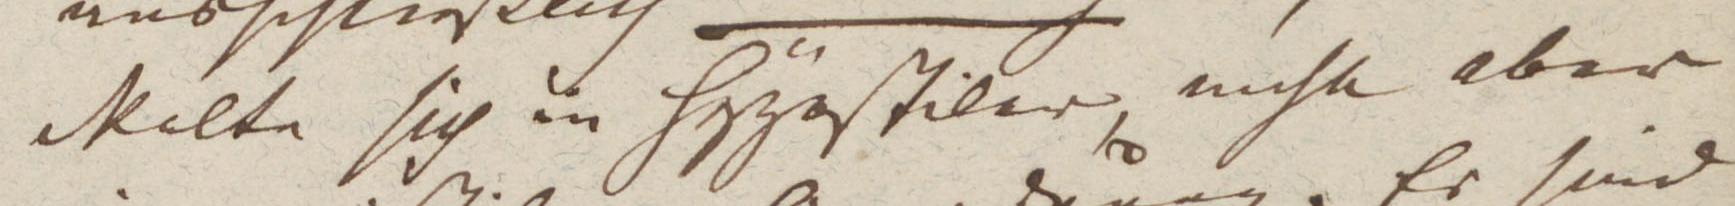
ckelte sich in hyostiler, nicht aber
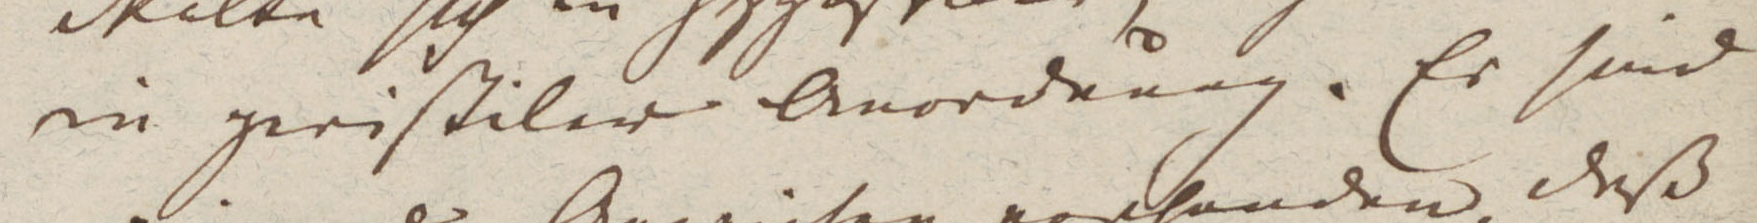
in peristiler Anordnung. Es sind
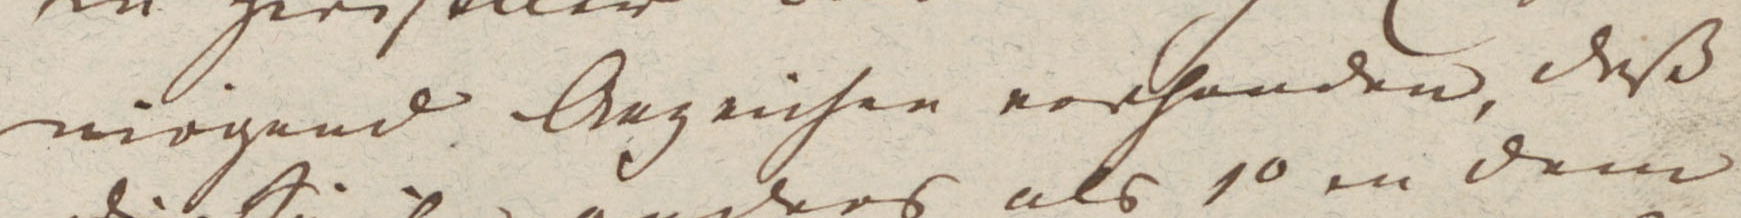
nirgend Anzeichen vorhanden, dass
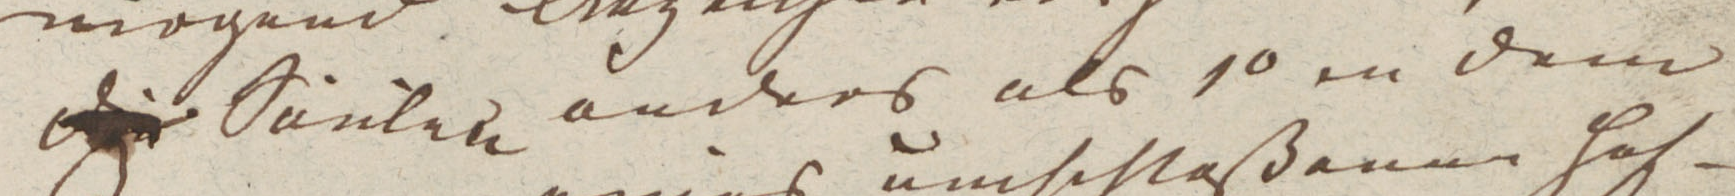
die Säulen anders als 1° in dem
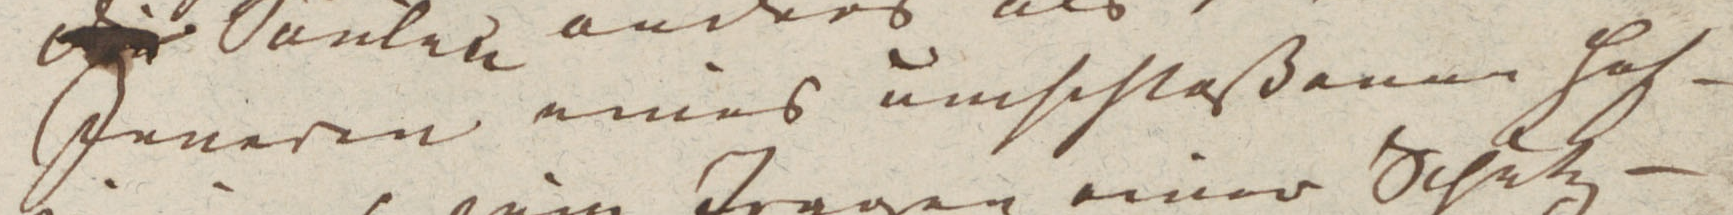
Inneren eines umschlossenen Hof-
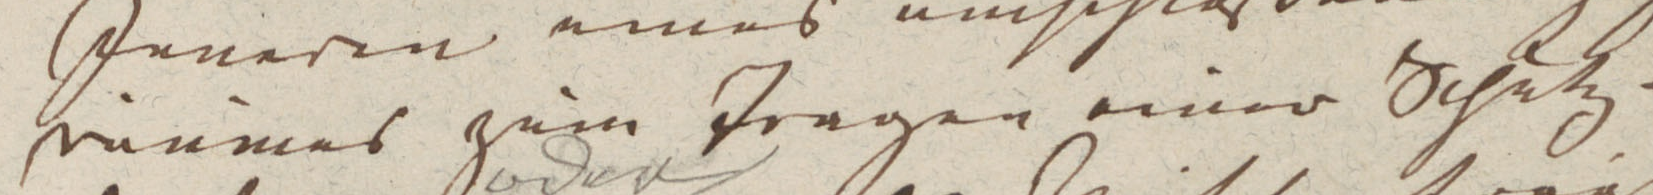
raumes zum Tragen einer Schutz-
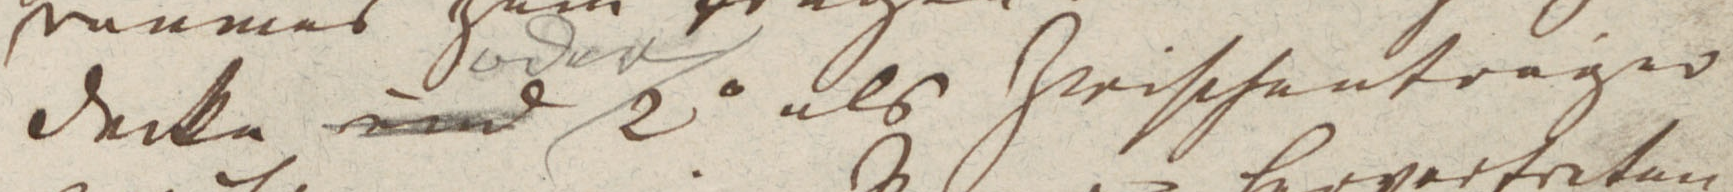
decke und oder 2° als Zwischenträger
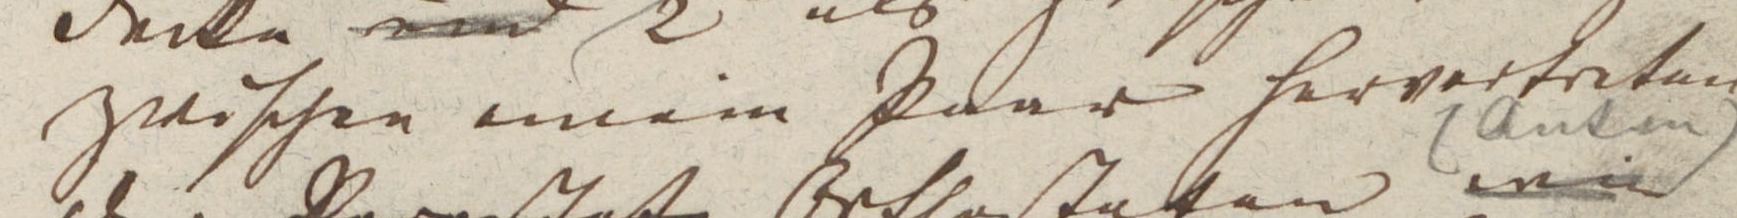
zwischen einem Paar hervortreten-
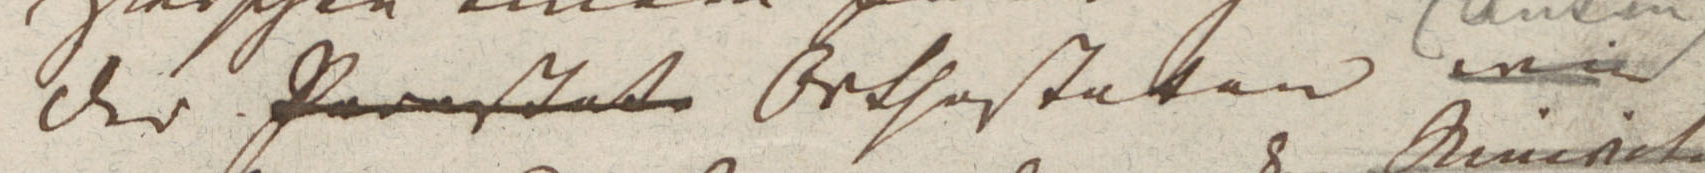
der Parastat Orthostaten wie
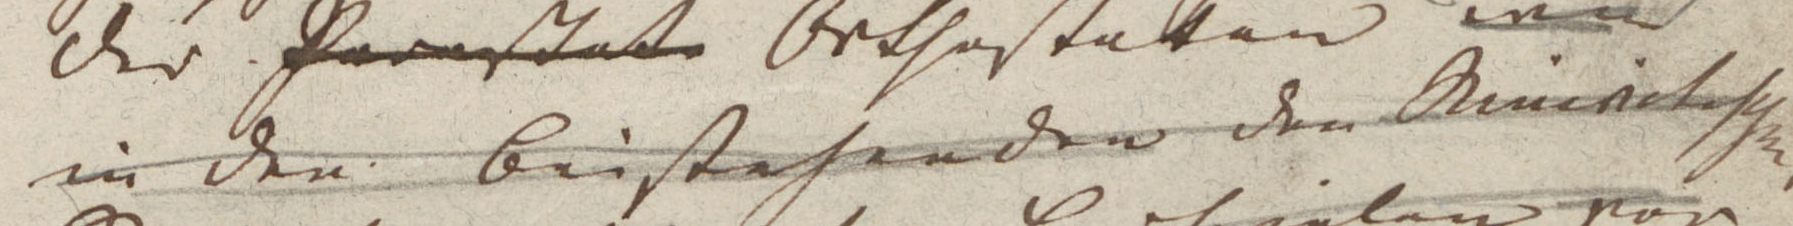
in den beistehenden den Ninivitischen
